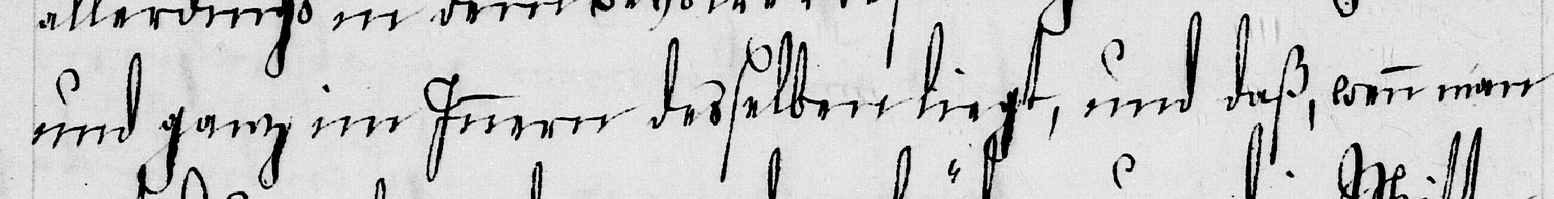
und ganz im Innern desselben liegt, und daß, wenn man
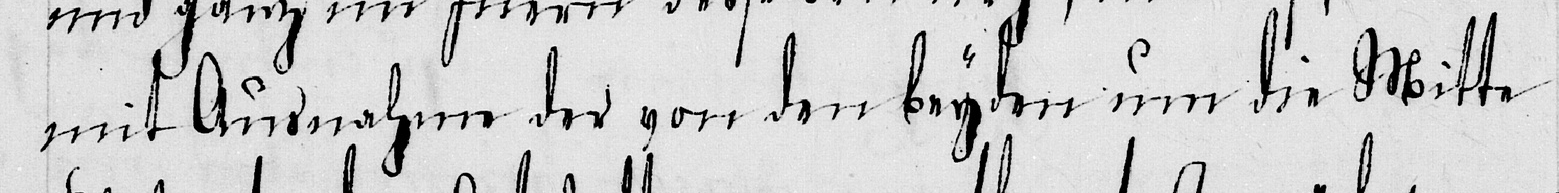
mit Ausnahme der von den beyden um die Mitte
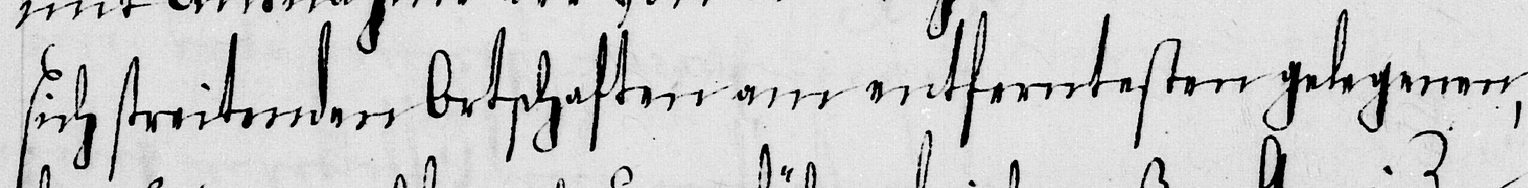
sich streitenden Ortschaften am entferntesten gelegenen,
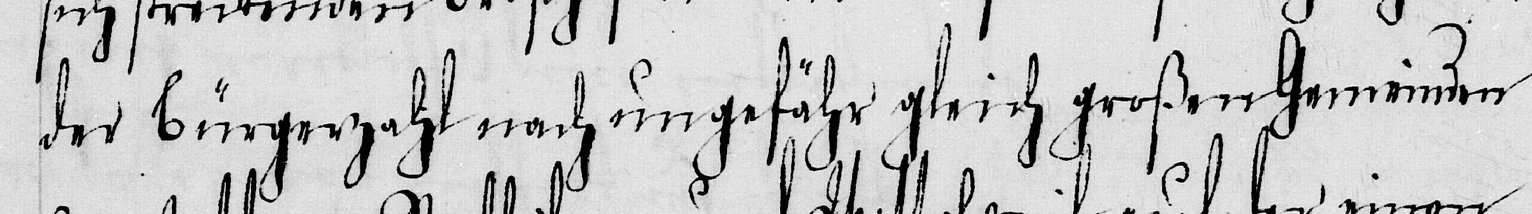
der Bürgerzahl nach ungefähr gleich großen Gemeinden
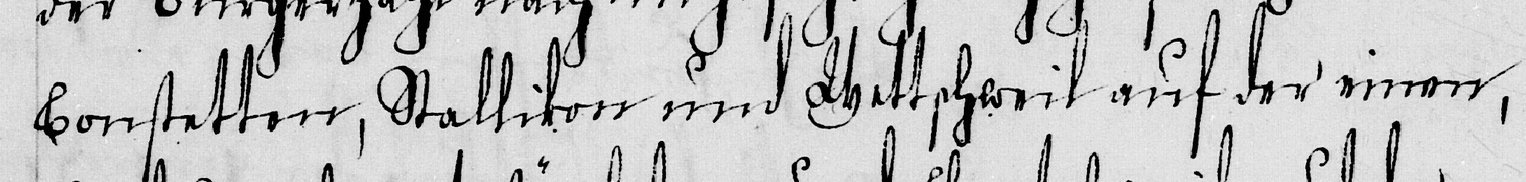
Bonstetten, Stallikon und Wettschweil auf der einen,
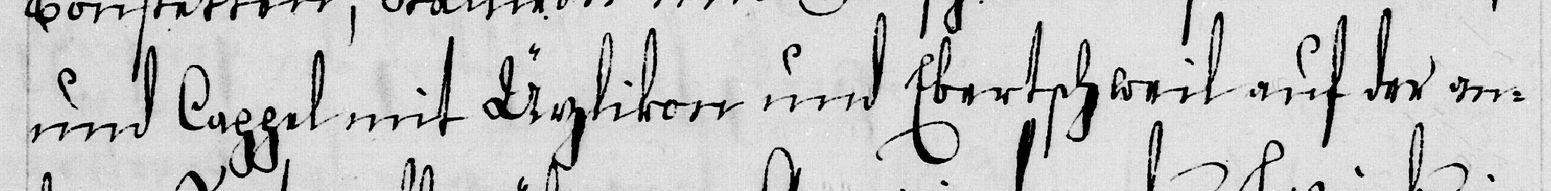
und Cappel und Uezlikon und Ebertschweil auf der an¬
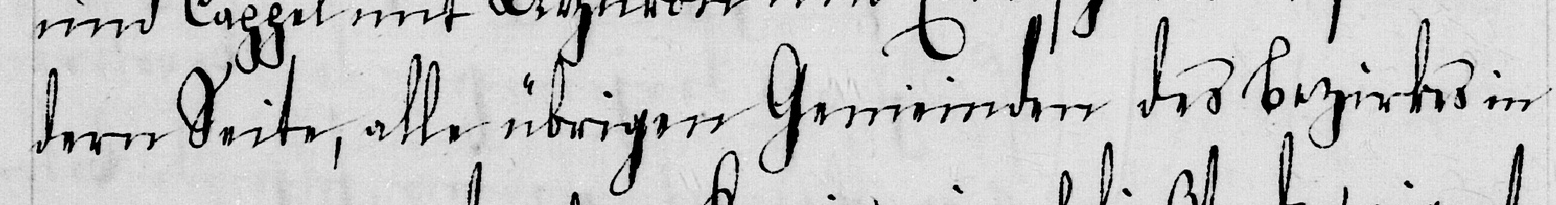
dern Seite, alle übrigen Gemeinden des Bezirkes in
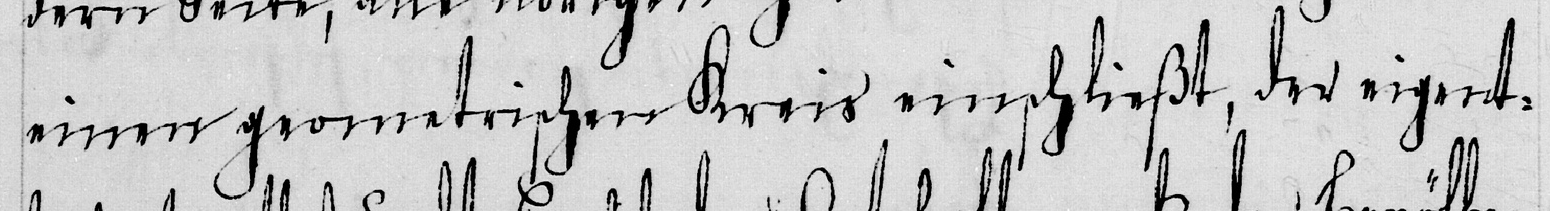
einen geometrischen Kreis einschließt, der eigent¬
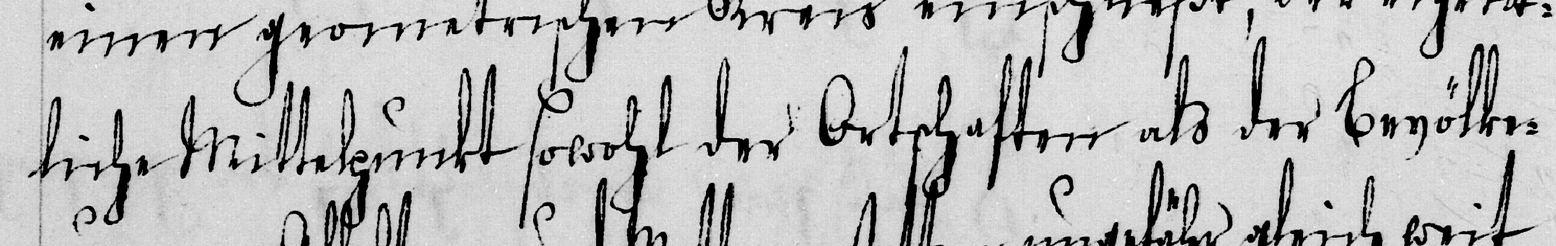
liche Mittelpunkt sowohl der Ortschaften als der Bevölke¬
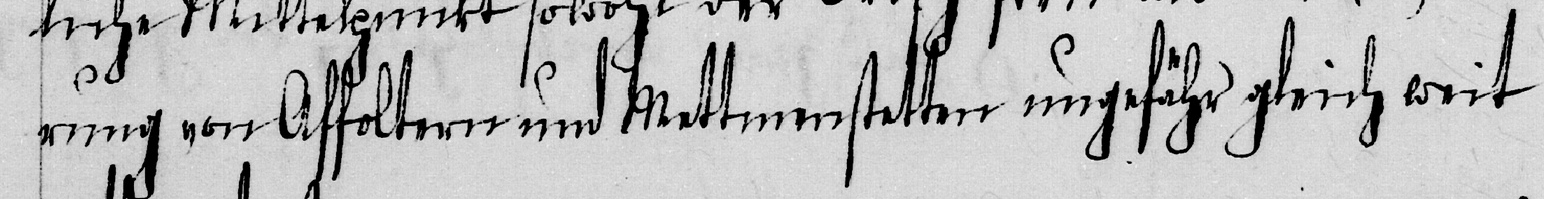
rung von Affoltern und Mettmenstetten ungefähr gleich weit
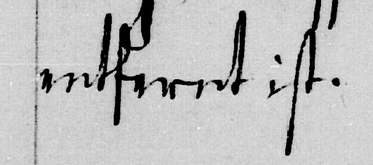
entfernt ist.
